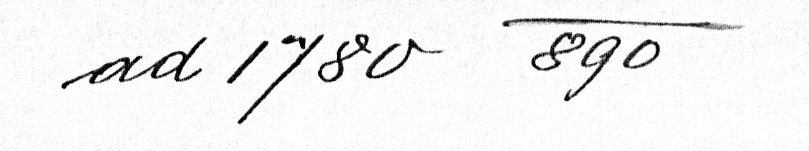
ad 1780 890
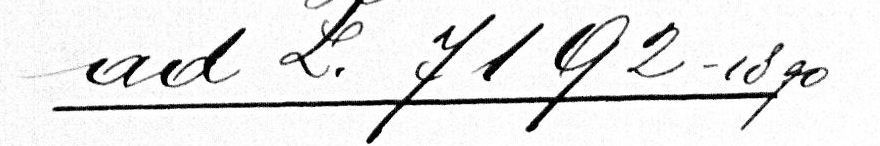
ad L. 7192 -1890
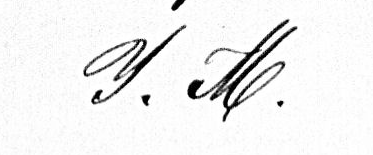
J. M.
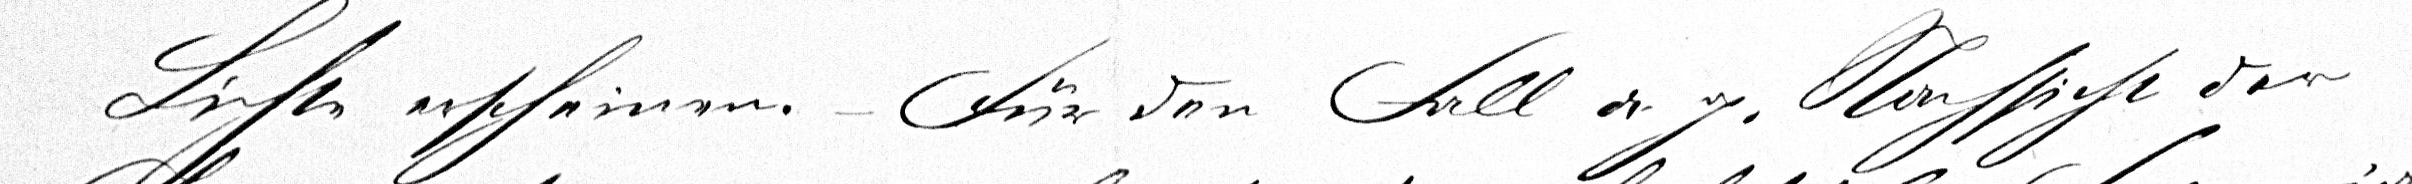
Lichte erscheinen. - Für den Fall a. g. Nachsicht der
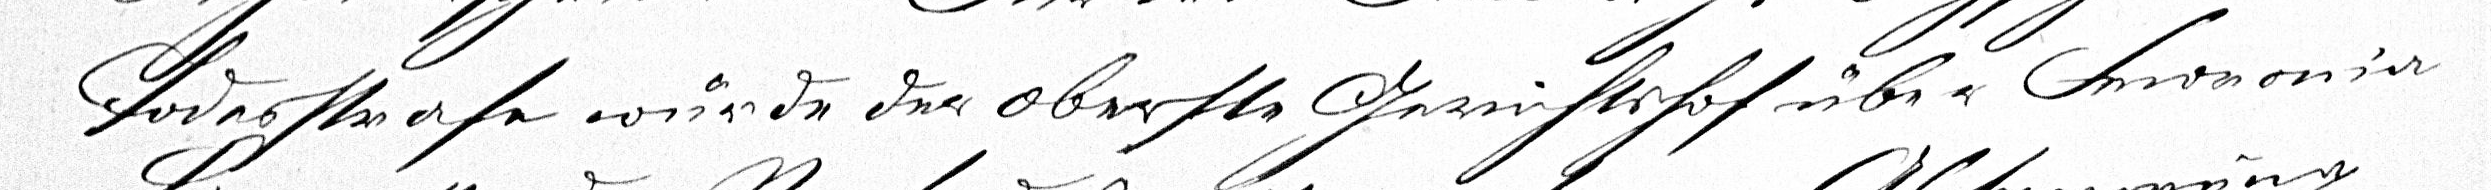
Todesstrafe wurde der oberste Gerichtshof über xx
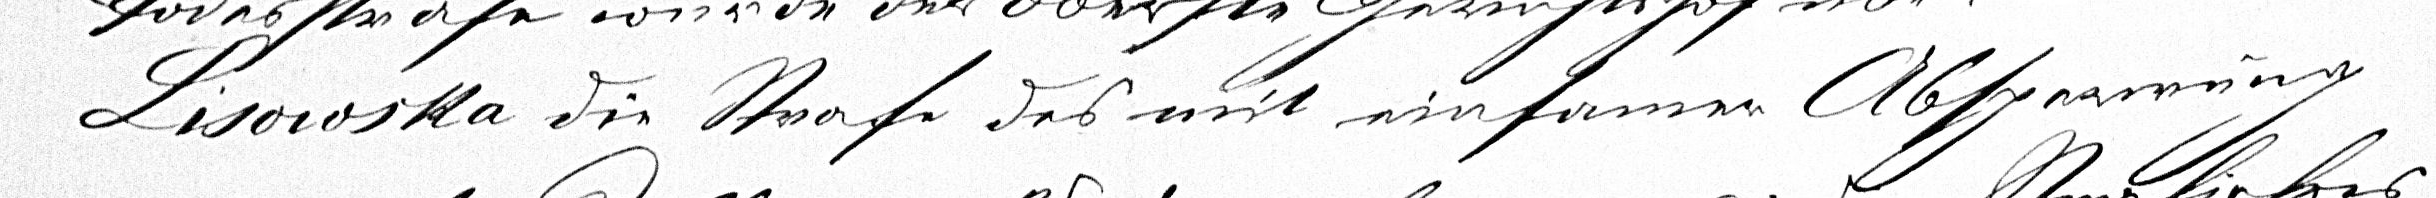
Lisowska die Strafe des mit einsamer Absperwung
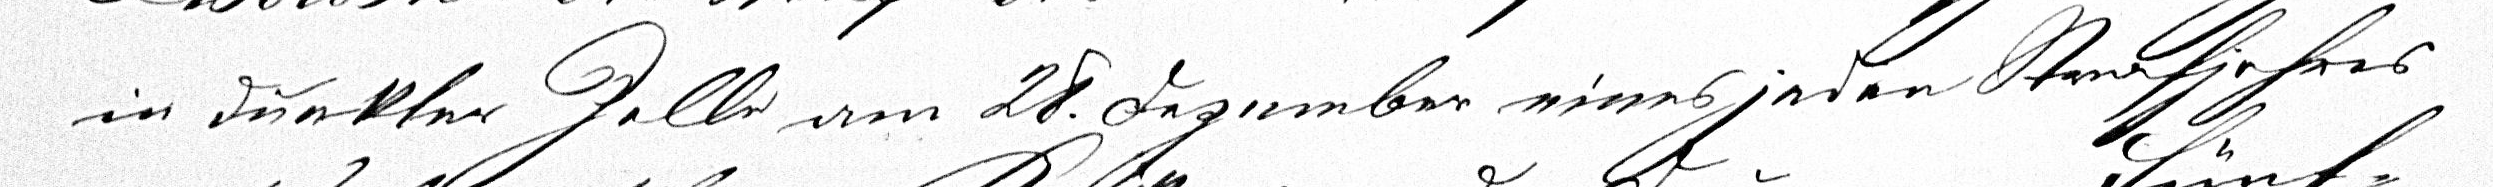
in dunkler Zelle am 28. Dezember eines jeden Strafjahres
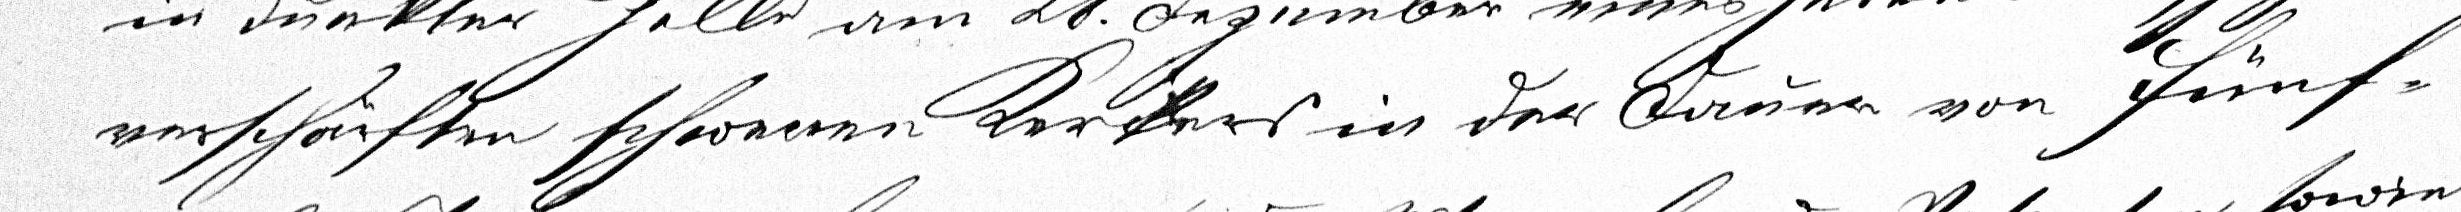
verschärften schweren Kerkers in der Dauer von fünf¬
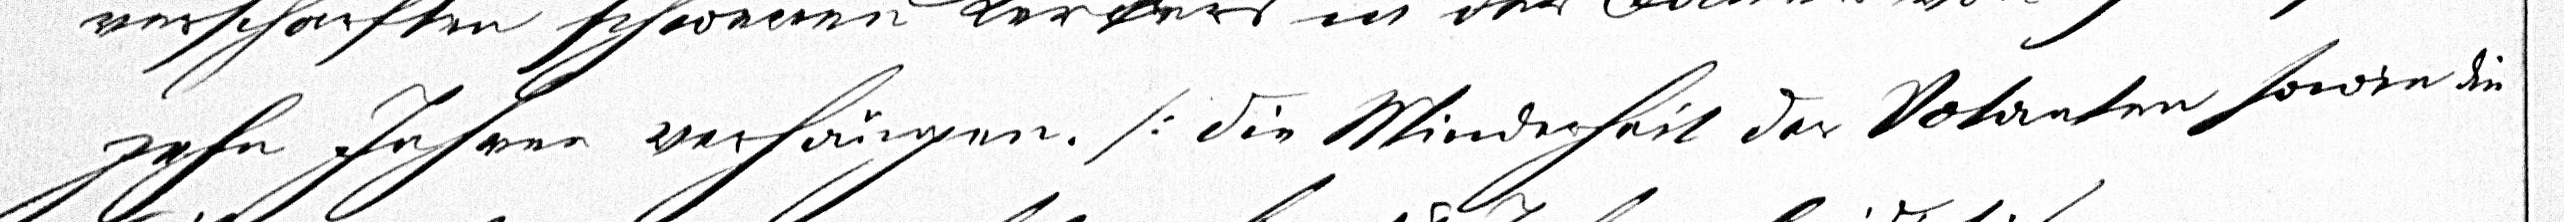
zehn Jahren verhängen. /:die Minderheit der Volanten sowie die
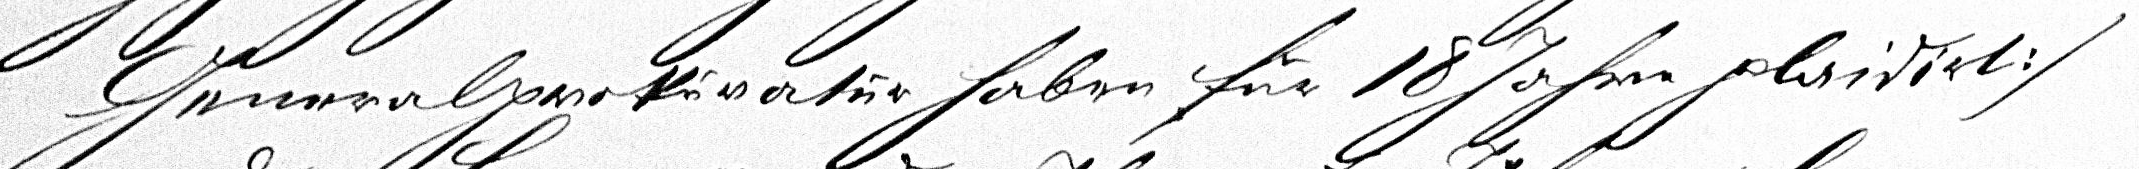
Generalprokuratur haben für 18 Jahre plaidirt:/
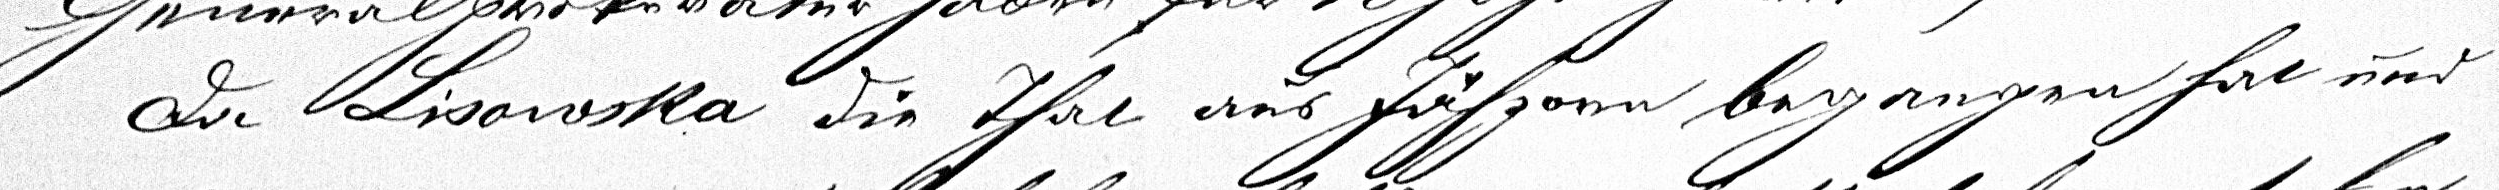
Da Lisowska die That aus Jähzorn begangen hat und
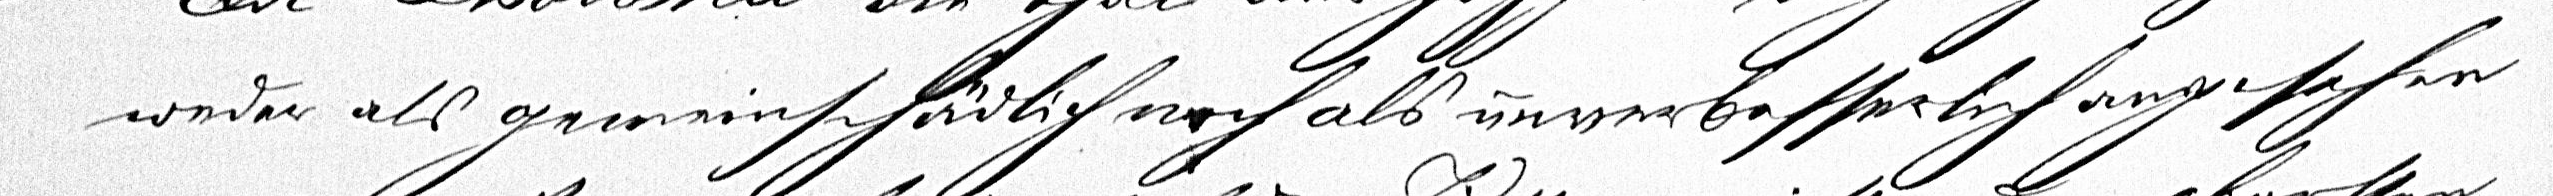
weder als gemeinschädlich noch als unverbesserlich angesehen
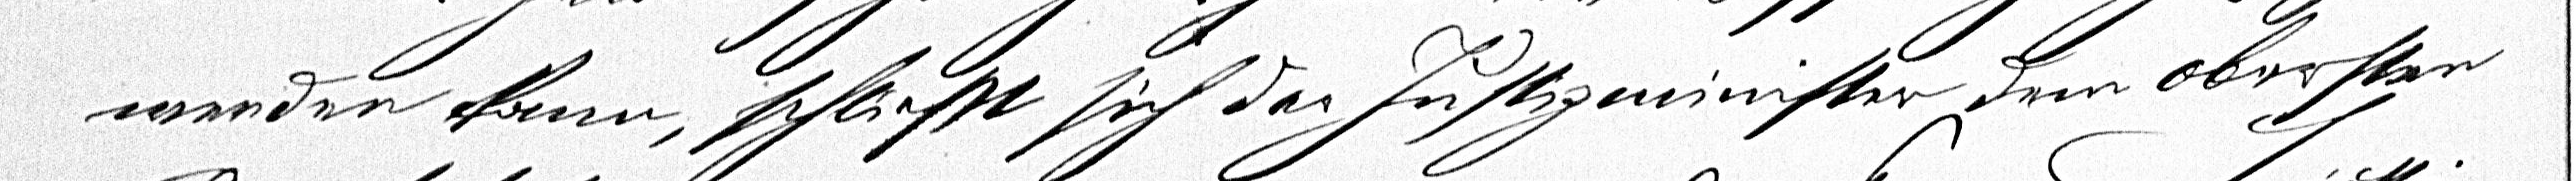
werden kann, schließt sich der Justizminister dem obersten
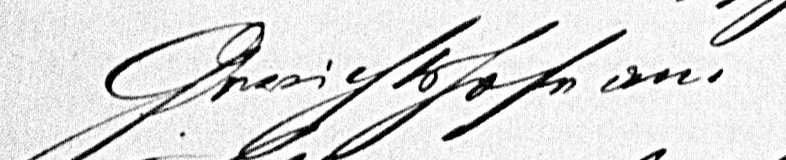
Gerichtshofe an.
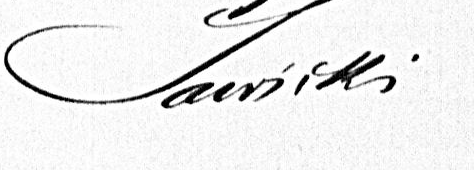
Sanwicki
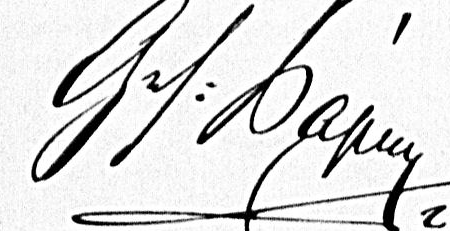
Ges: Bapxx
